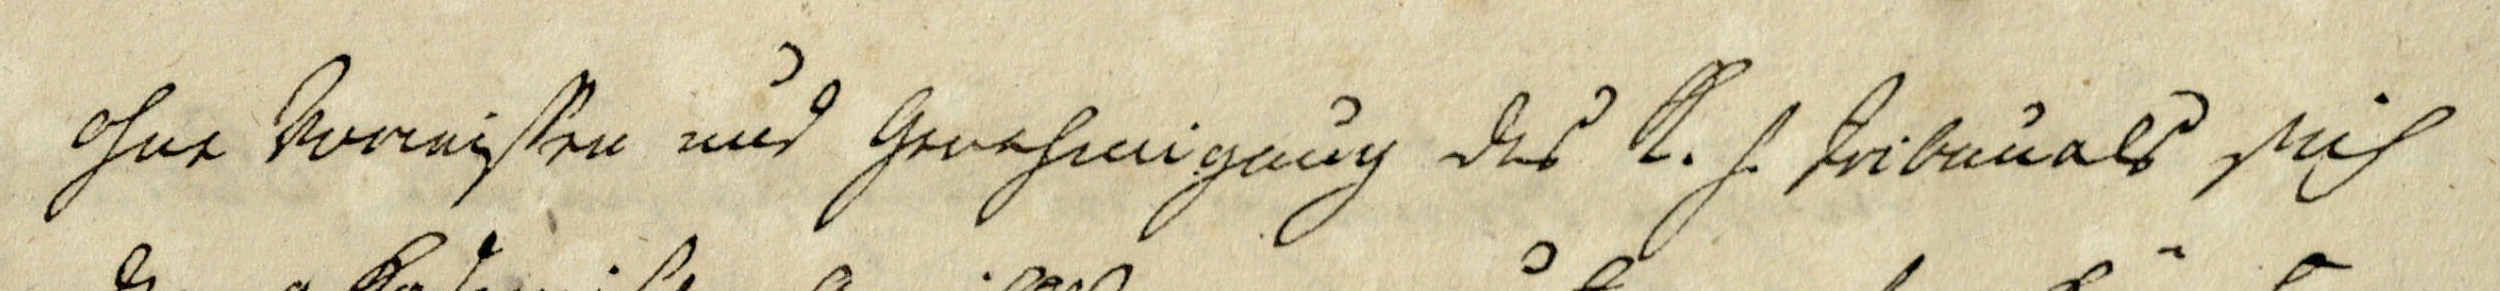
ohne Vorwissen und Genehmigung des K. h. Tribunals sich
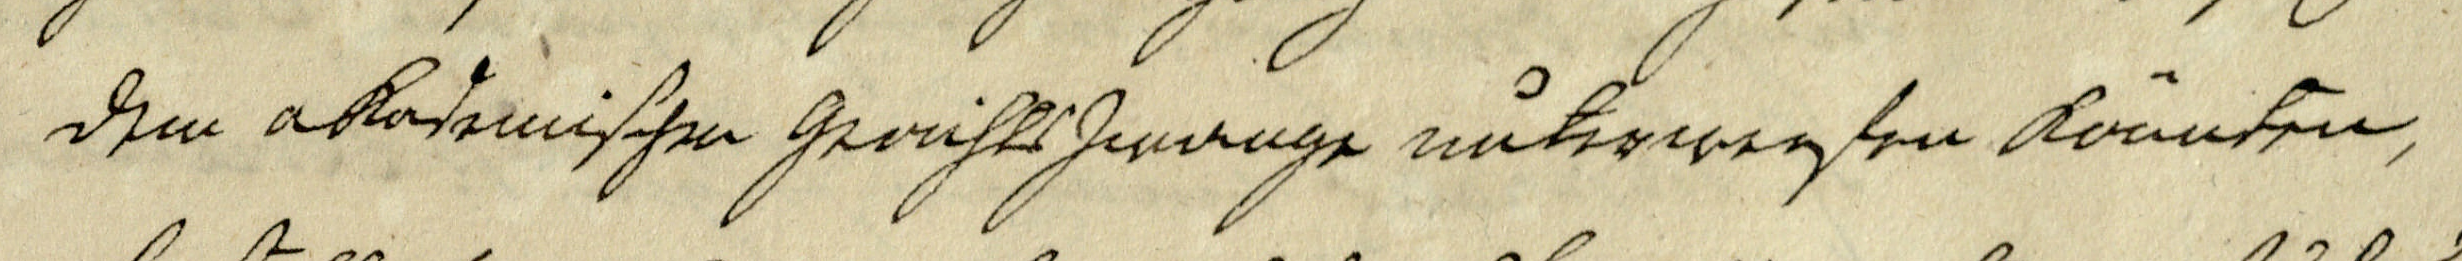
dem akademischen Gerichtszwange unterwerfen könnten,
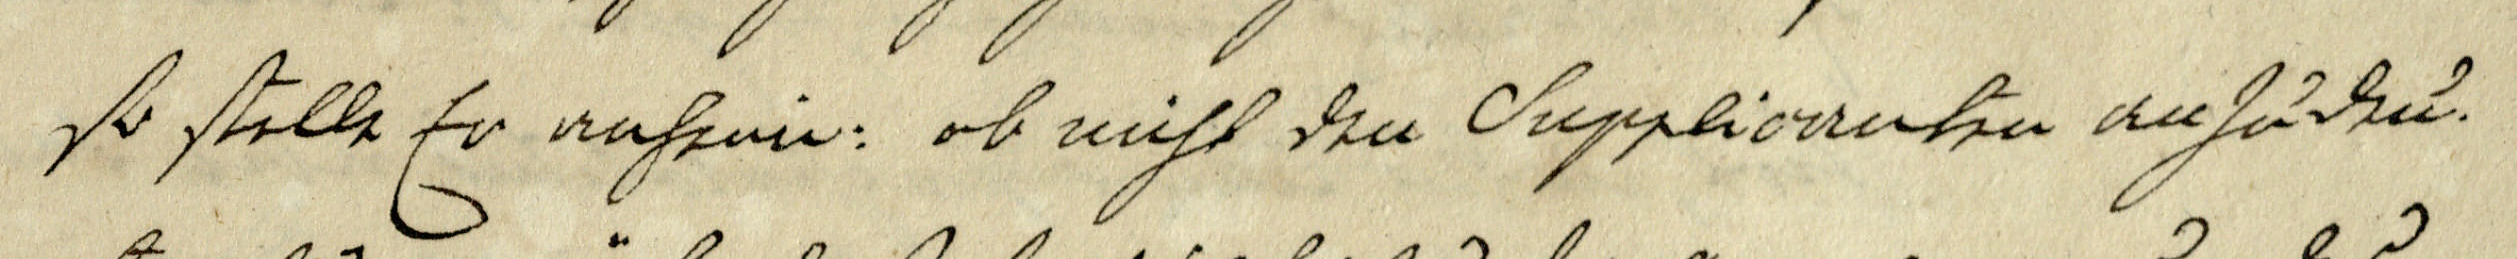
so stelle Er anheim: ob nicht den Supplicanten anzudeu¬
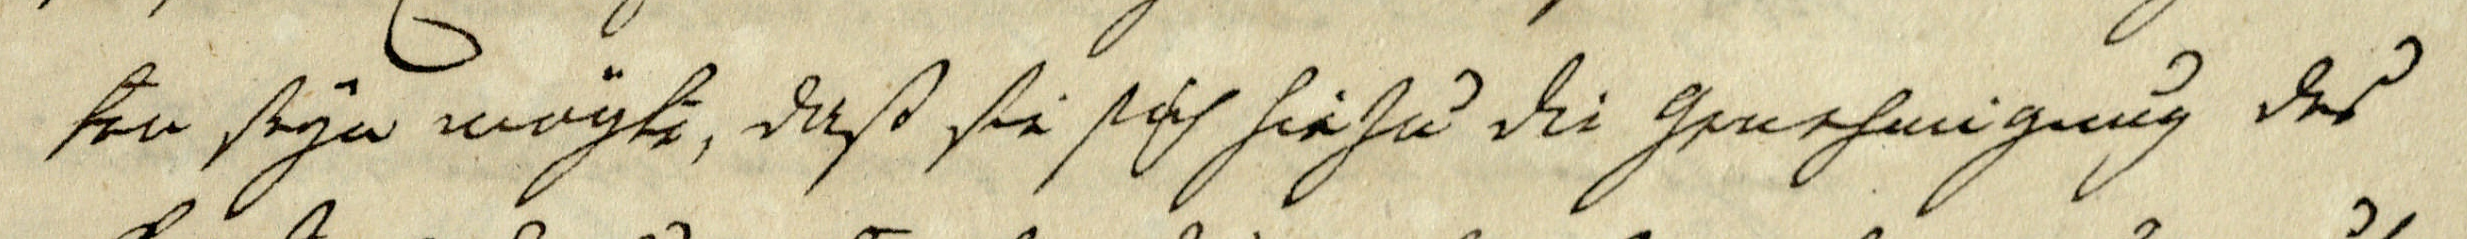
ten seÿn mögte, daß sie sich hiezu die Genehmigung des
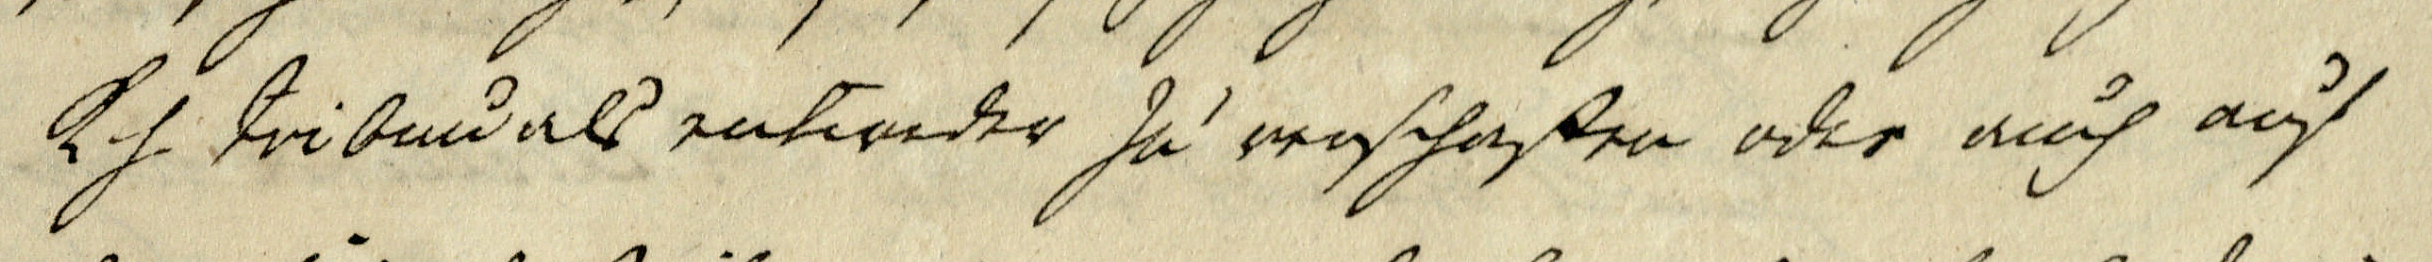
K. h. Tribunals entweder zu verschafen oder auch auf
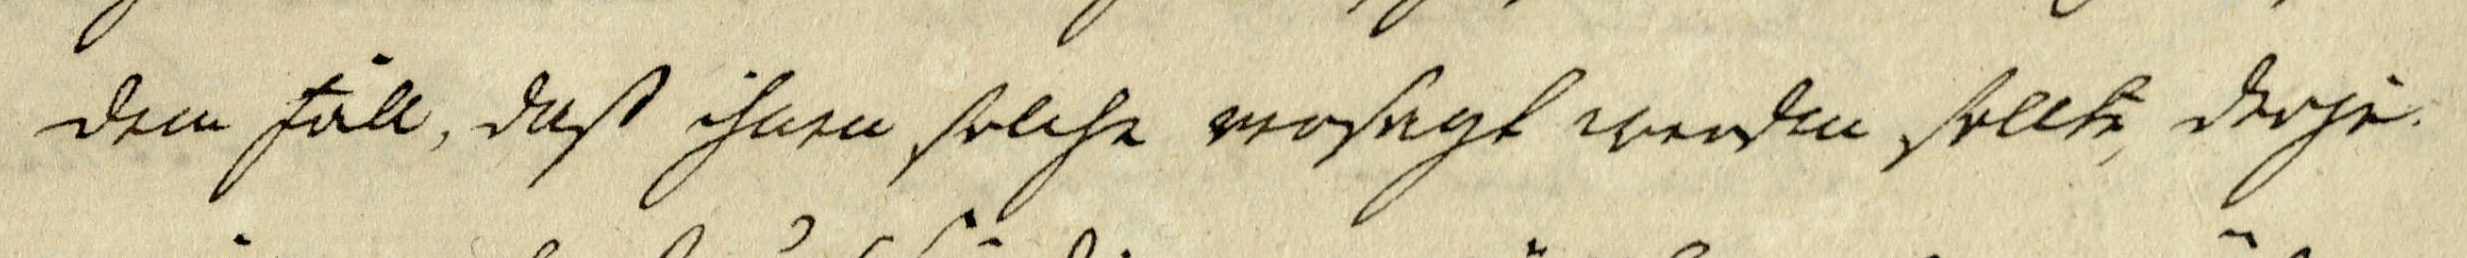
dem Fall, daß ihnen solche versagt werden sollte, derje¬
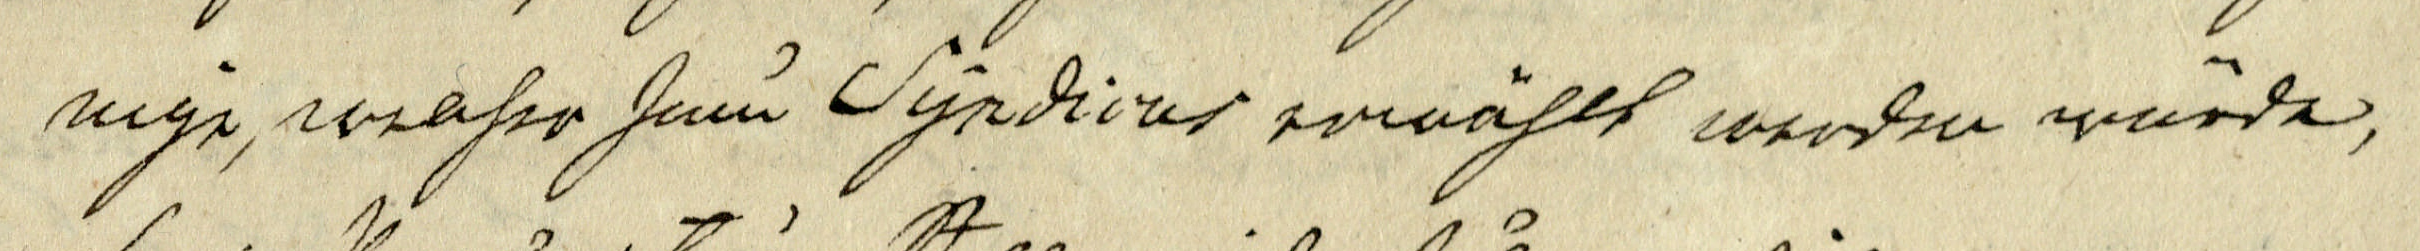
nige, welcher zum Sÿndicus erwählt werden würde,
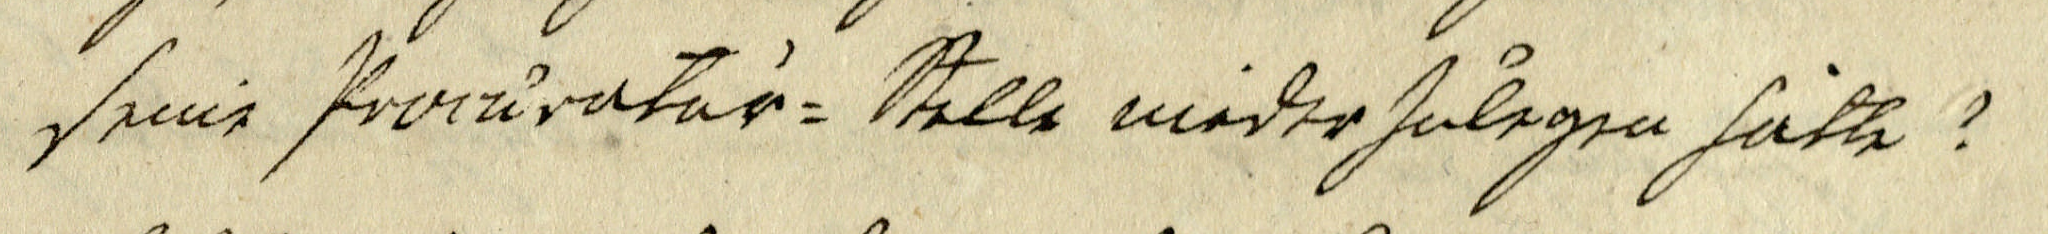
seine Procuratur- Stelle niederzulegen hätte?
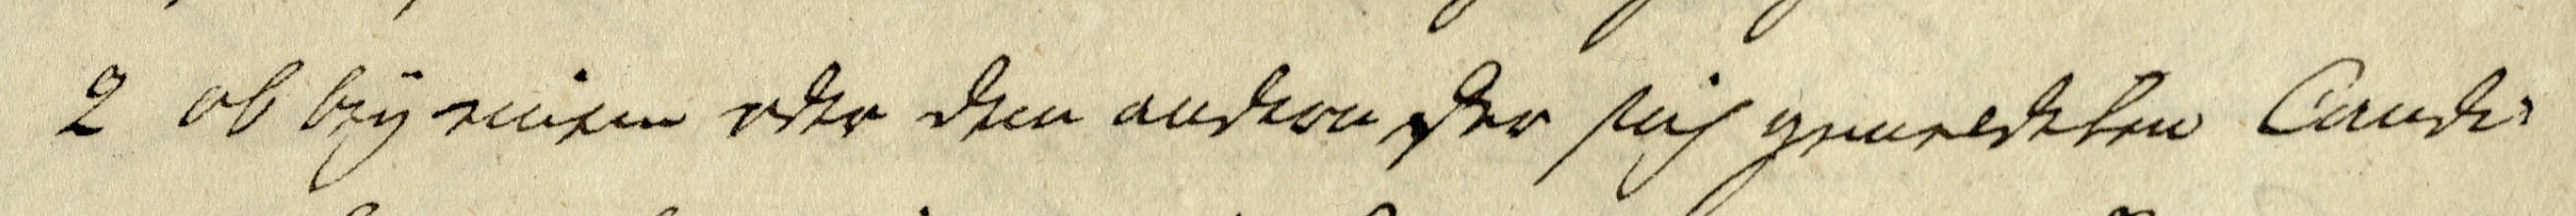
2. ob beÿ einem oder dem andern der sich gemeldeten Candi¬
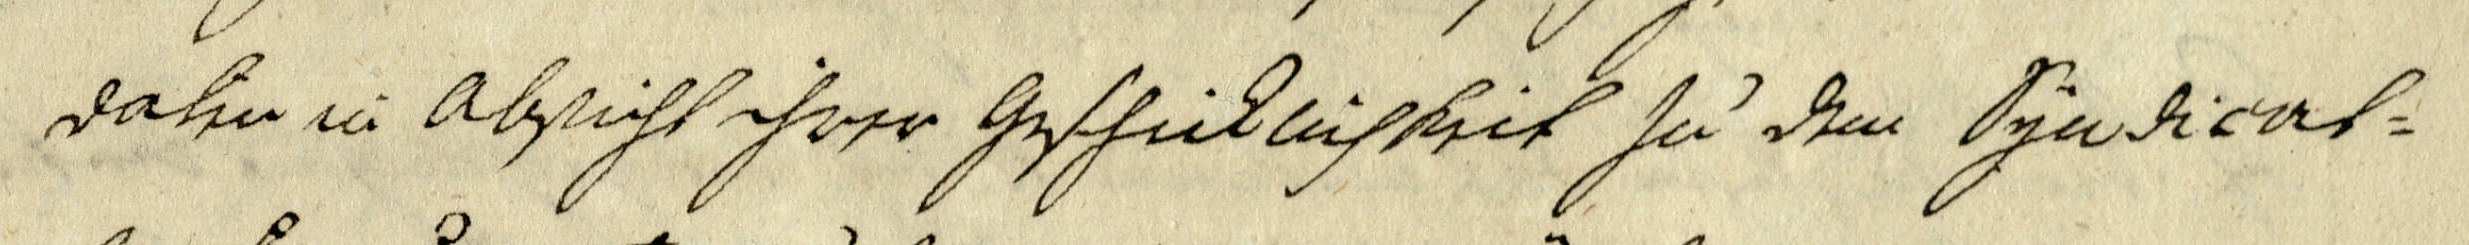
daten in Absicht ihrer Geschicklichkeit zu dem Sÿndicat-
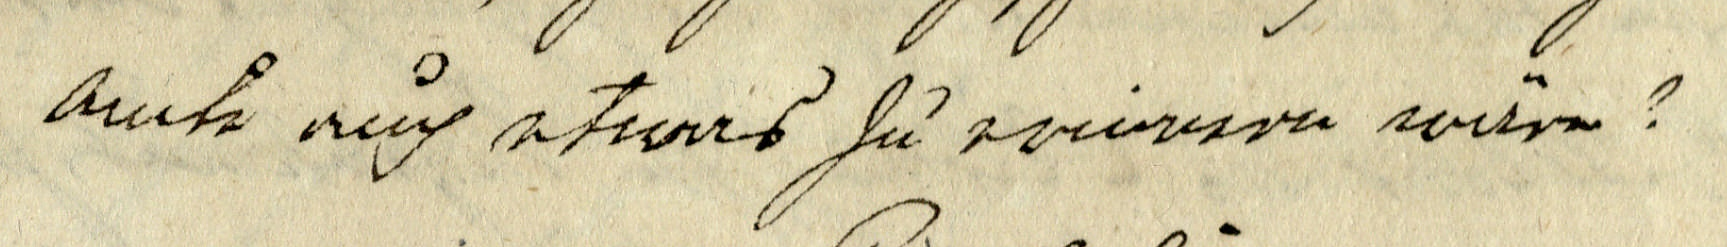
Amte auch etwas zu erinnern wäre?
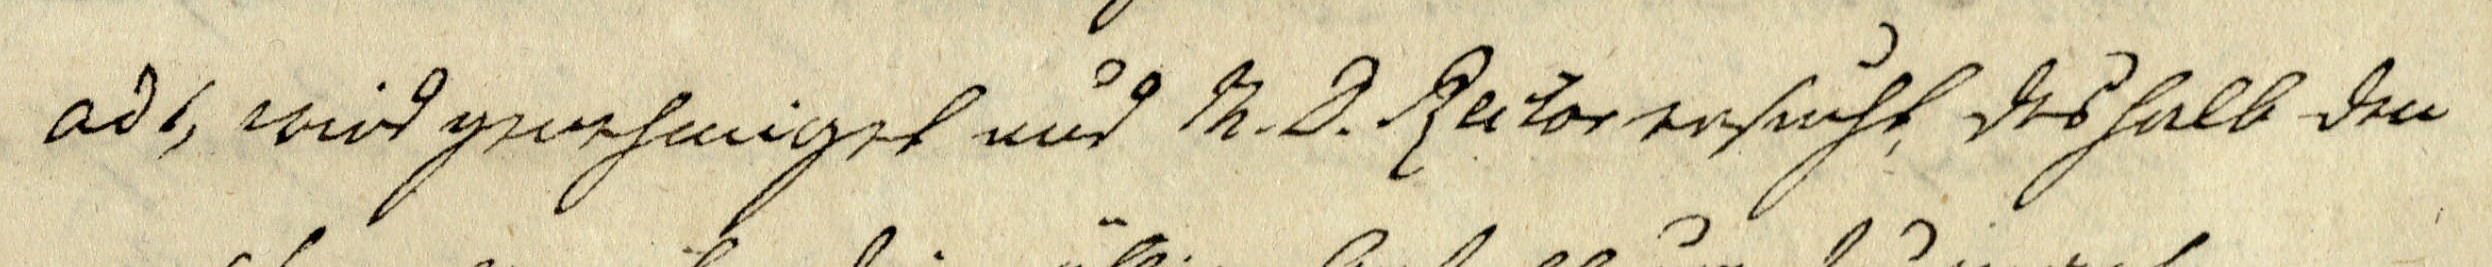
ad 1, wird genehmiget und M. D. Rector ersucht, deshalb den
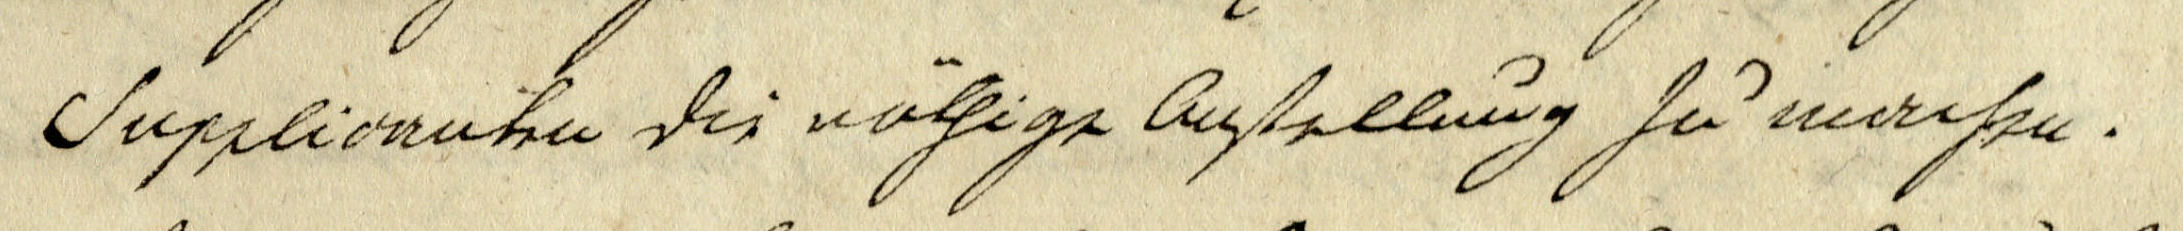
Supplicanten die nöthige Anstellung zu machen.
